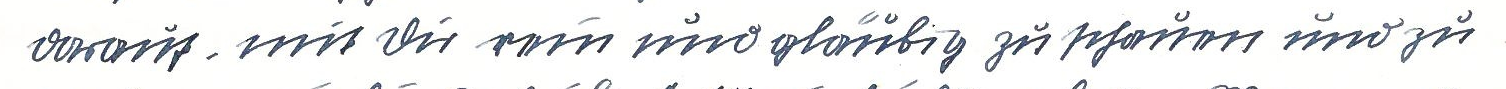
darauf, mit Dir rein und gläubig zu schauen und zu
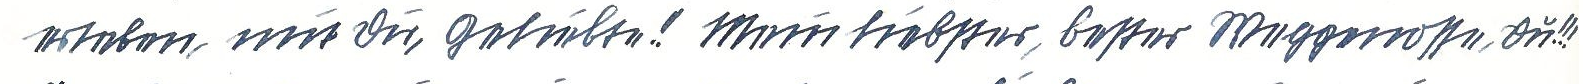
erleben, mit Dir, Geliebte!! Mein liebster, bester Weggenosse, Du!!!
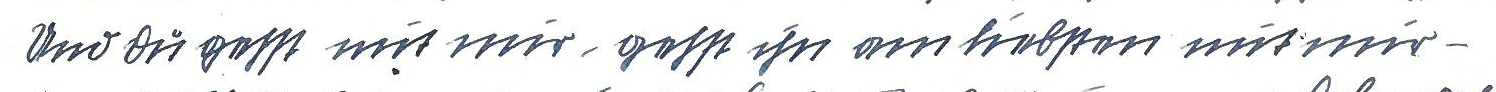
Und Du gehst mit mir, gehst ihn am liebsten mit mir –
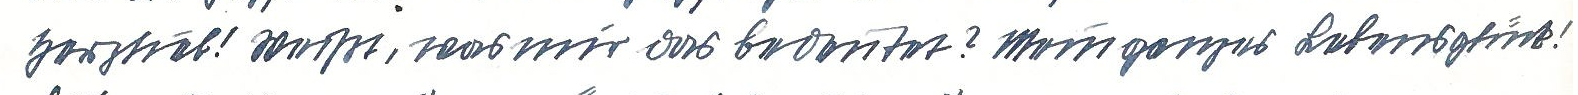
Herzlieb! Weißt, was mir das bedeutet? Mein ganzes Lebensglück!
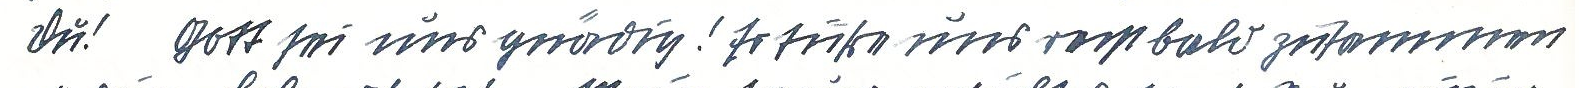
Du! Gott sei uns gnädig! Er führe uns recht bald zusammen
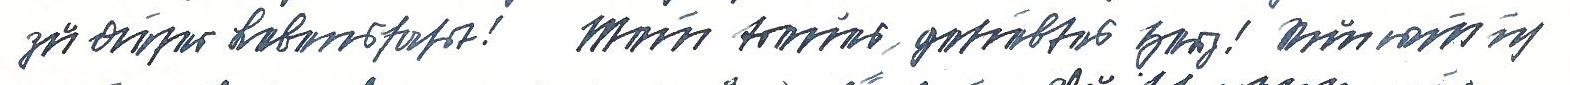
zu dieser Lebensfahrt! Mein treues, geliebtes Herz! Nun will ich
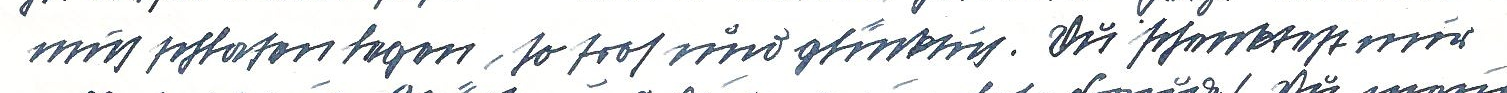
mich schlafen legen, so froh und glücklich. Du schenktest mir
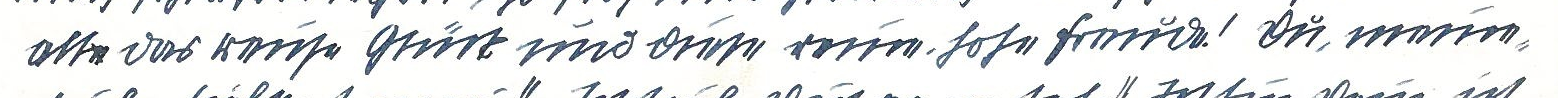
alle das reiche Glück und diese reine, hohe Freude! Du, meine
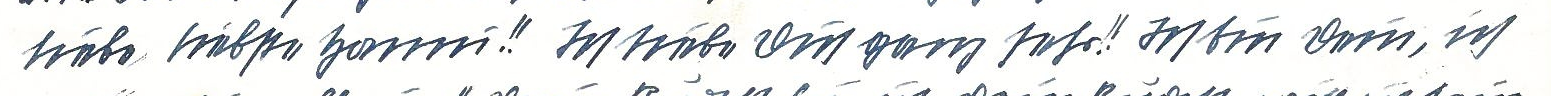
liebe, liebste!! Ich liebe Dich ganz sehr!! Ich bin Dein, ich
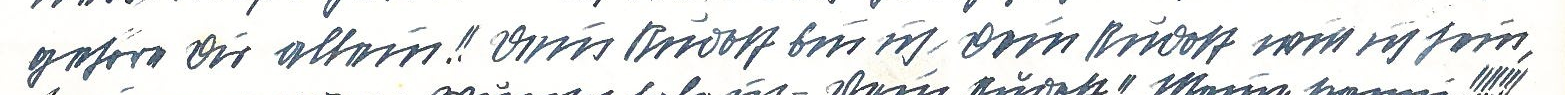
gehöre Dir allein!! Dein bin ich, Dein will ich sein,
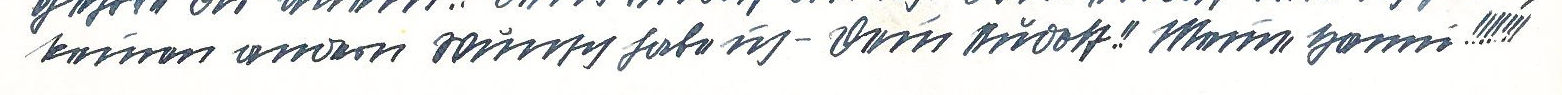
keinen andern Wunsch habe ich – Dein!! Meine!!!!!!!
